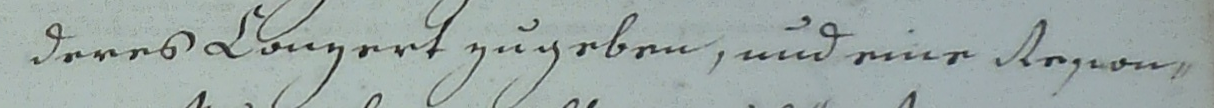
deres Conzert zugeben, und eine Reson¬
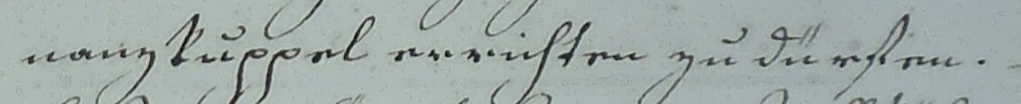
nanzkuppel errichten zu dürfen. __
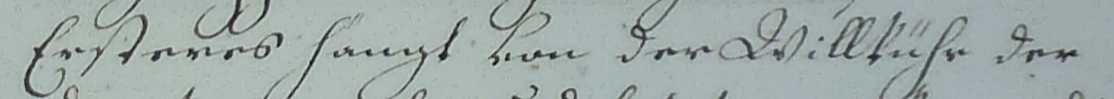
Ersteres hängt von der Willkühr der
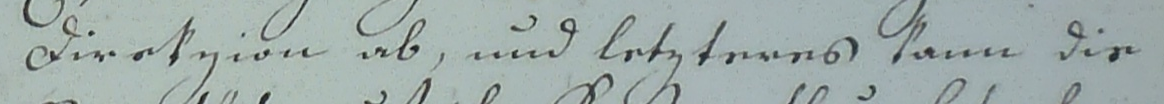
Direkzion ab, und letzteres kann die
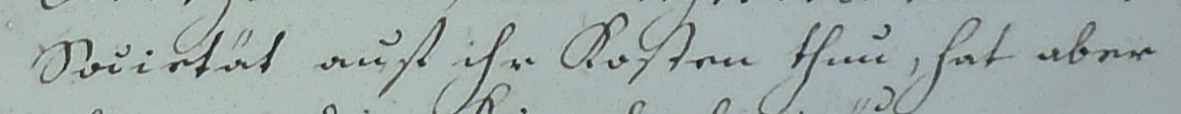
Societät auf ihr Kosten thun, hat aber
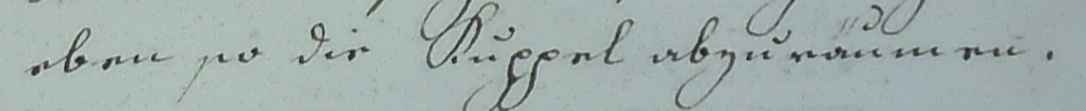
eben so die Kuppel abzuräumen.
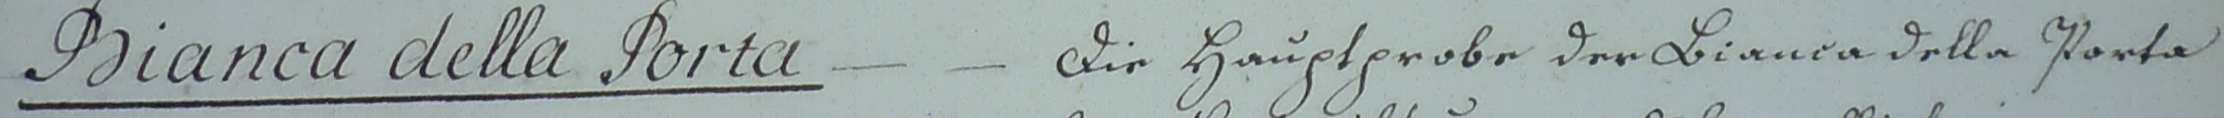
Bianca della Porta _ _ Die Hauptprobe der Bianca della Porta
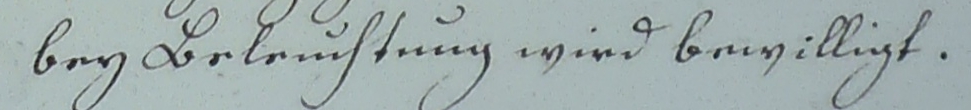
bey Beleuchtung wird bewilligt.
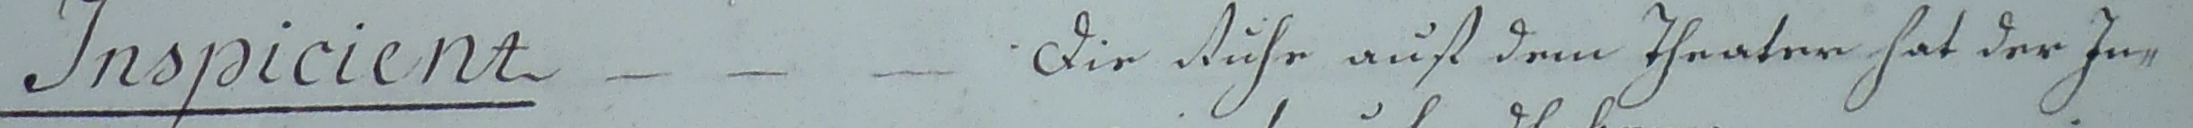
Inspicient _ _ _ Die Ruhe auf dem Theater hat der In¬
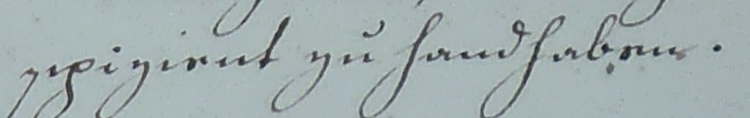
spizient zu handhaben.
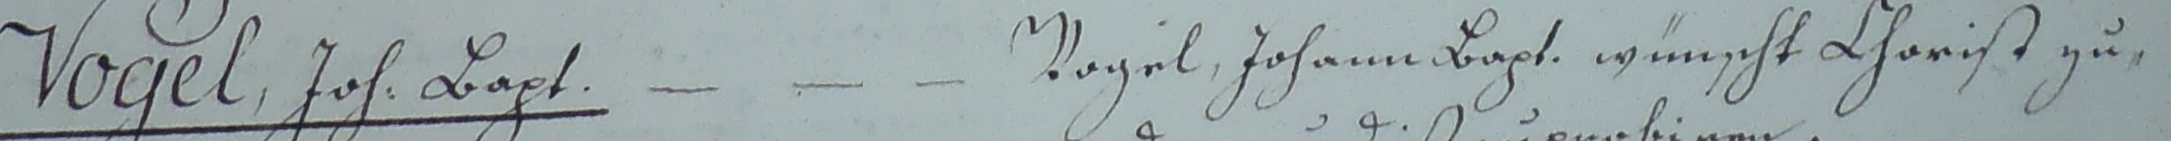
Vogel, Joh: Bapt. _ _ _ Vogel, Johann Bapt. wünscht Chorist zu¬
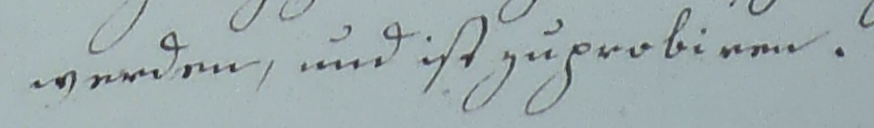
werden, und ist zuprobiren.
